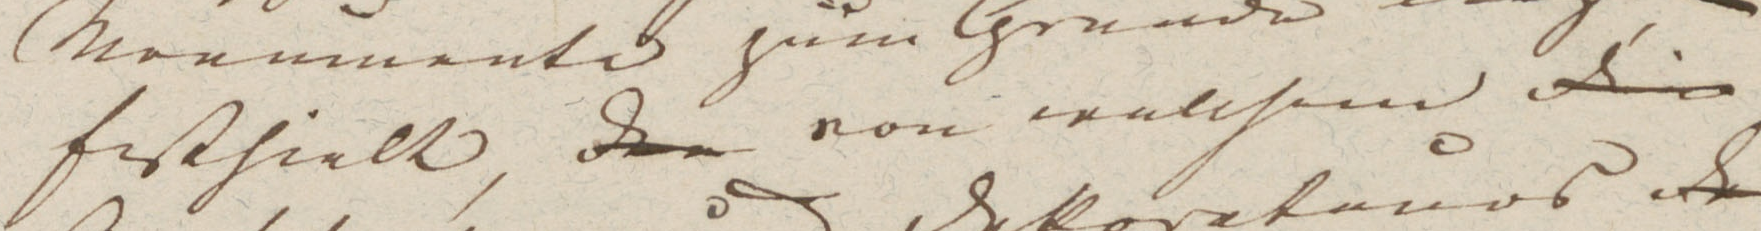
festhielt, den von welchem die
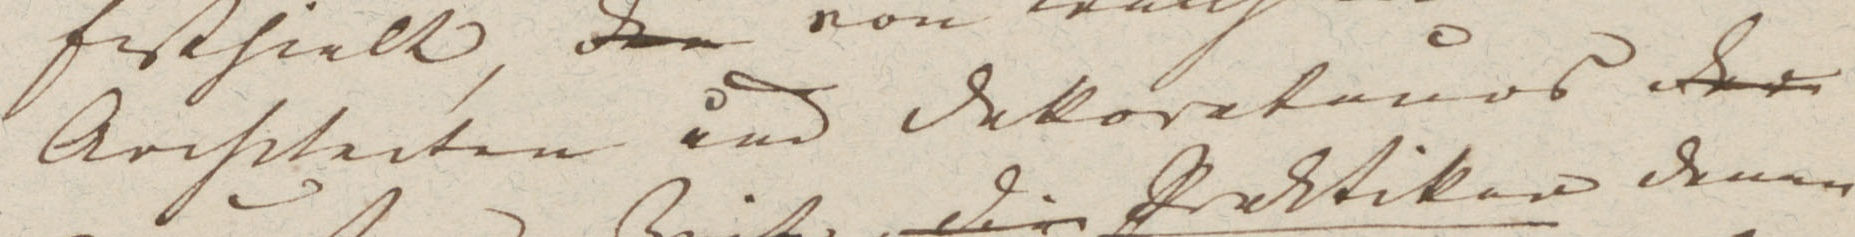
Architecten und Dekorateurs der
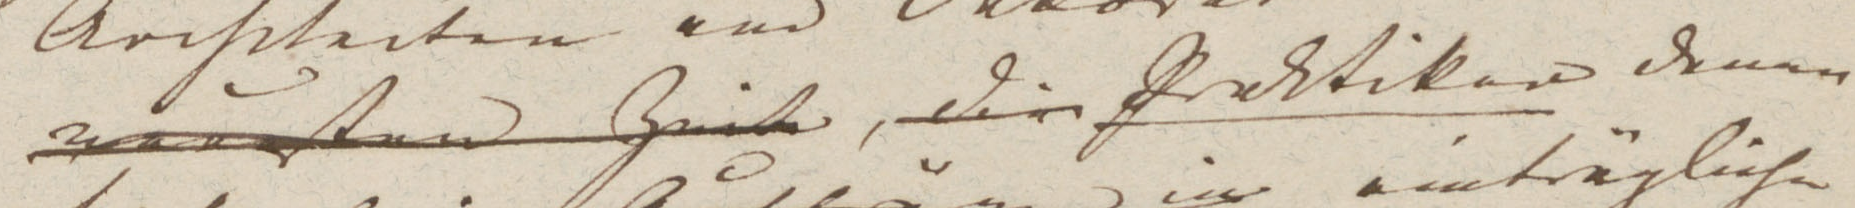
neuesten Zeit, die Praktiker denen
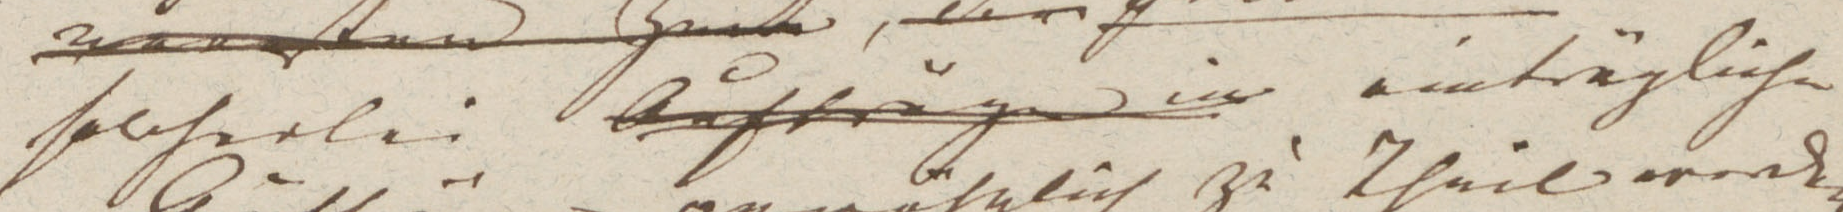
solcherlei Aufträge in einträgliche
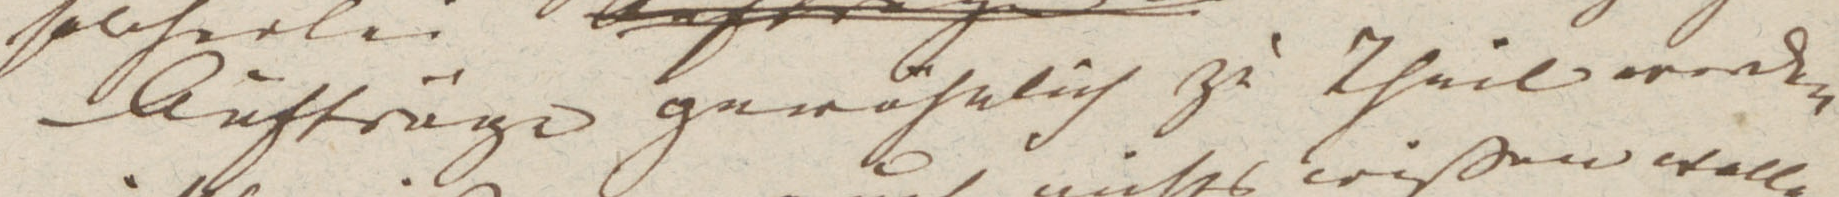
Aufträge gewöhnlich zu Theil werden
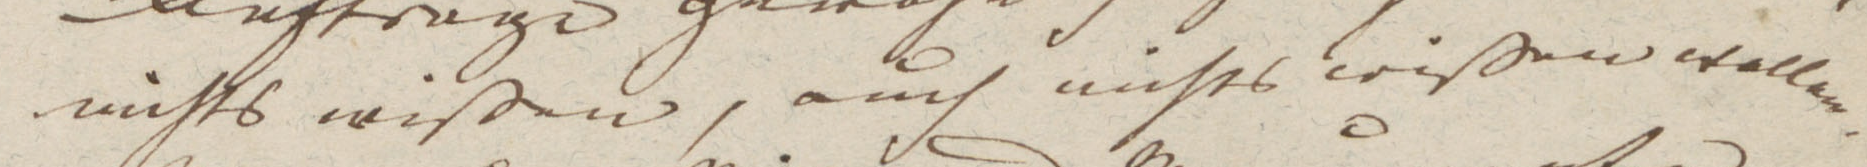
nichts wissen, auch nichts wissen wollen.
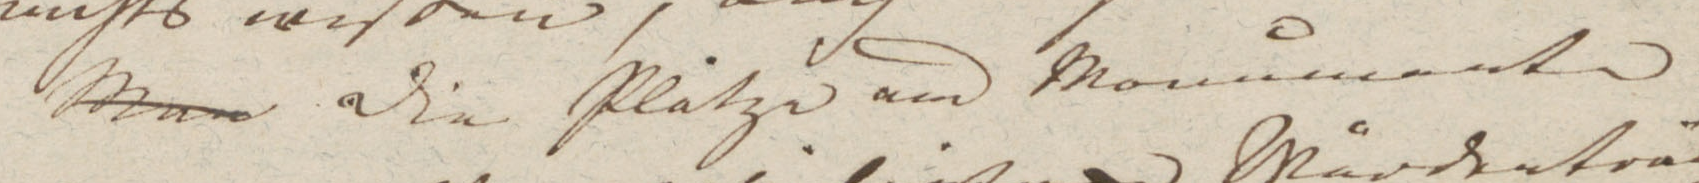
Man Die Plätze und Monumente
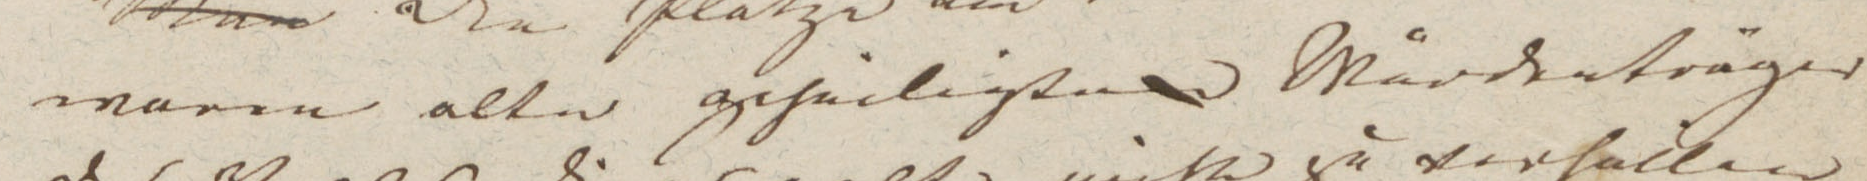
waren alte geheiligten Würdeträger
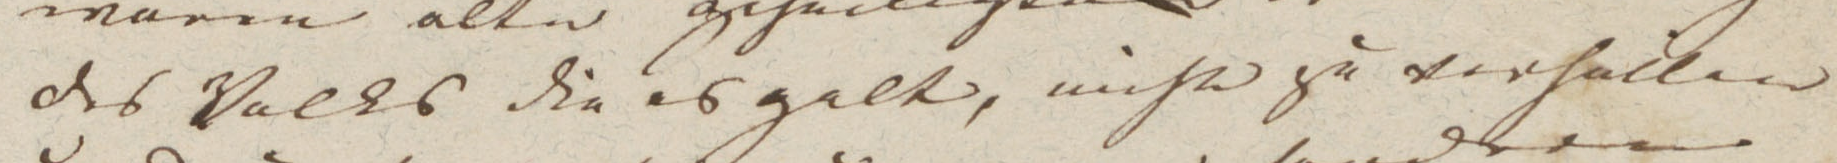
des Volks die es galt, nicht zu verhüllen
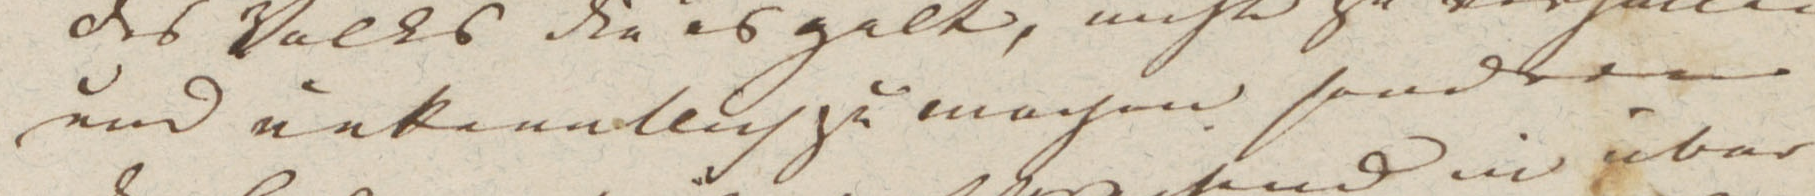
und unkenntlich zu machen sondern
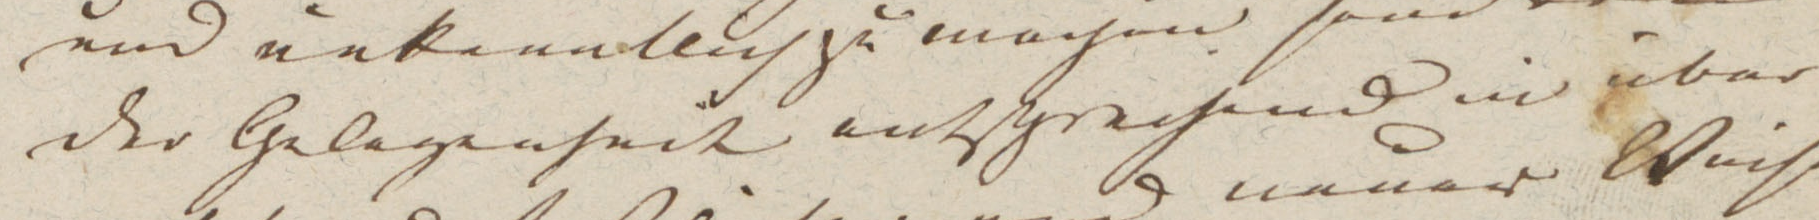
der Gelegenheit entsprechend in über-
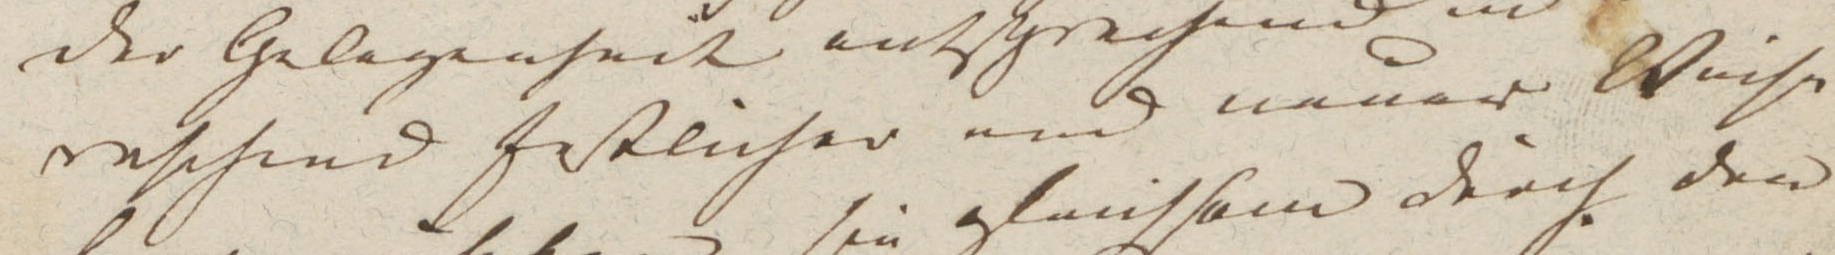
raschend festlicher und neuer Weise
